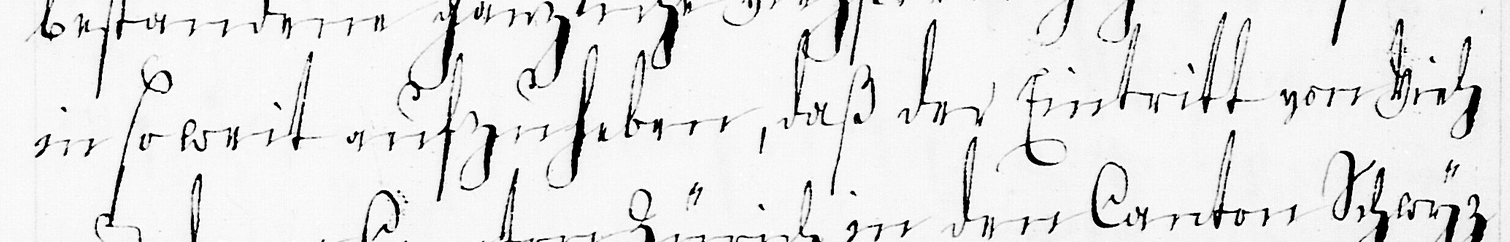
in so weit aufzuheben, daß der Eintritt von Vieh
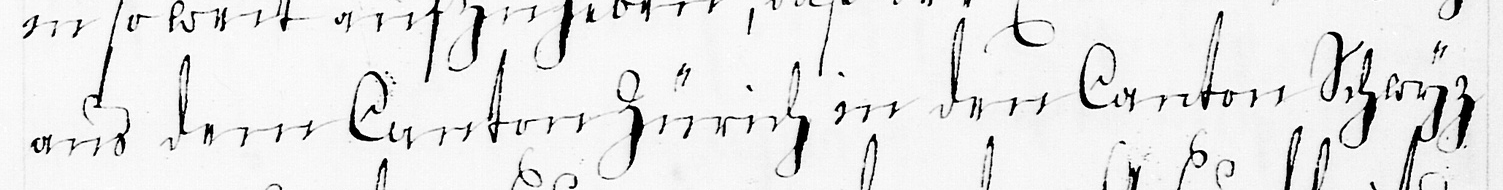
aus dem Canton Zürich in den Canton Schwyz
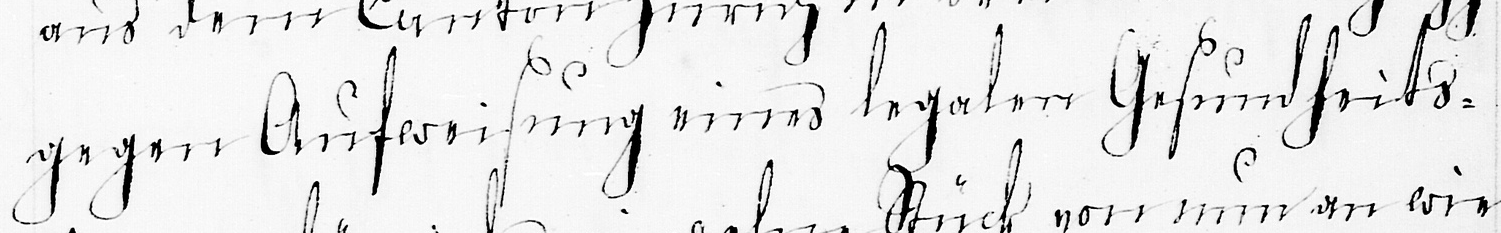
gegen Aufweisung eines legalen Gesundheits¬
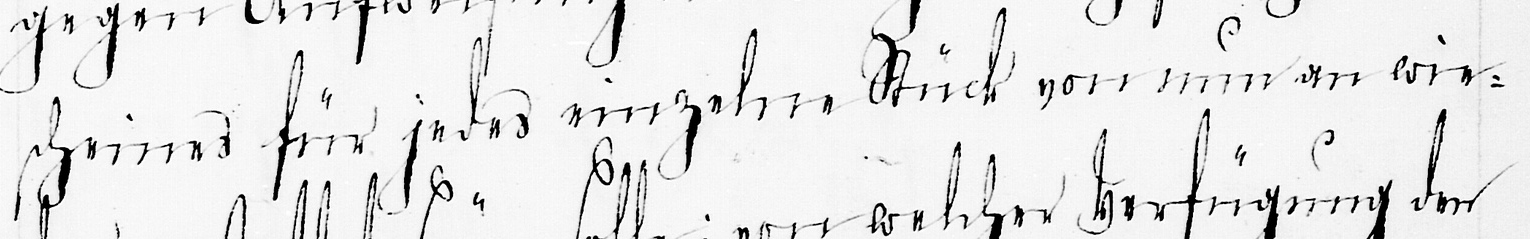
scheines für jedes einzelne Stück von nun an wie¬
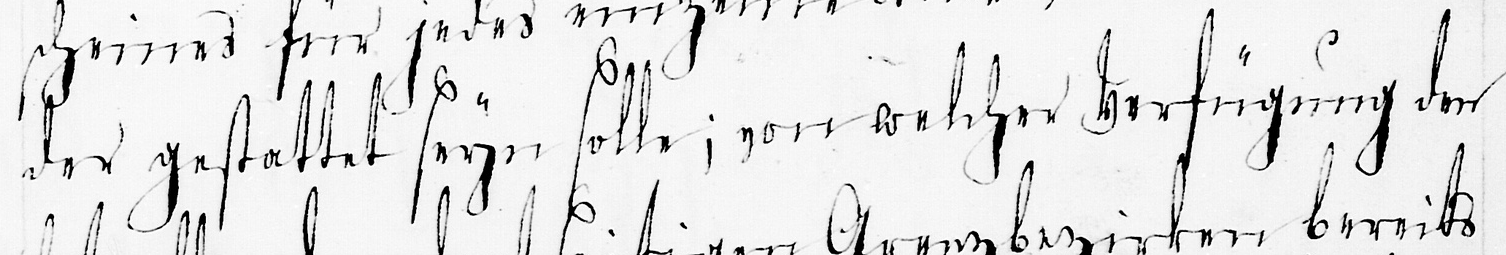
der gestattet seyn solle; von welcher Verfügung den
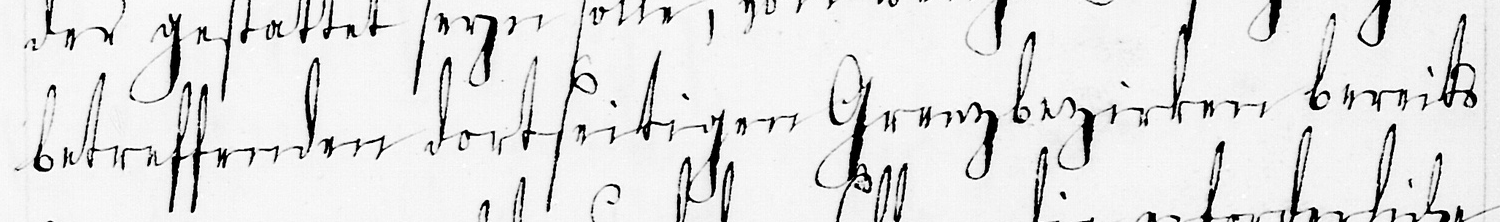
betreffenden dortseitigen Grenzbezirken bereits
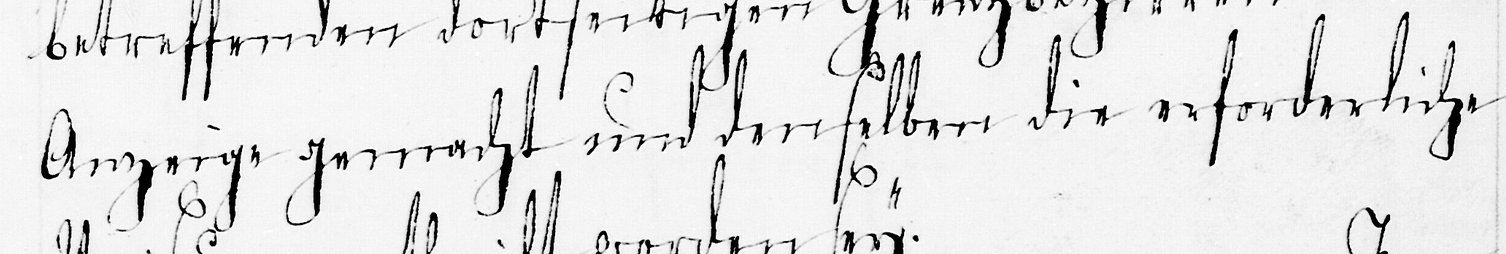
Anzeige gemacht und denselben die erforderliche
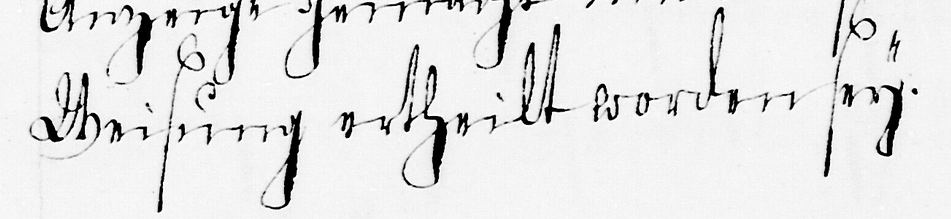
Weisung ertheilt worden sey.
